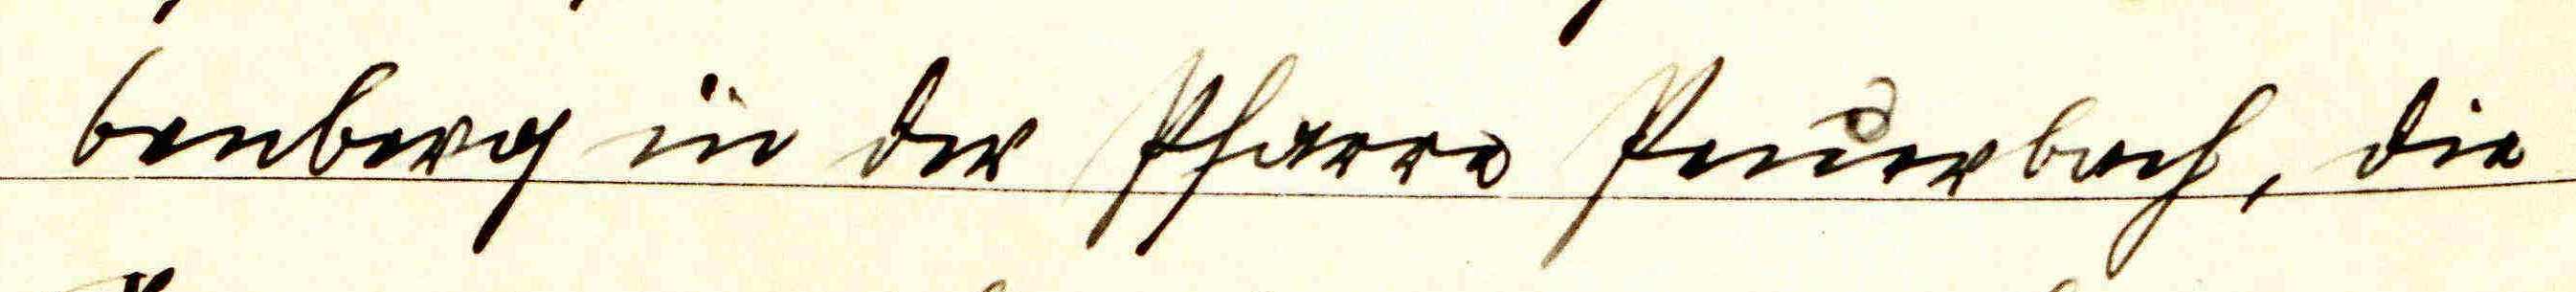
chberg in der Pfarre Peuerbach, die
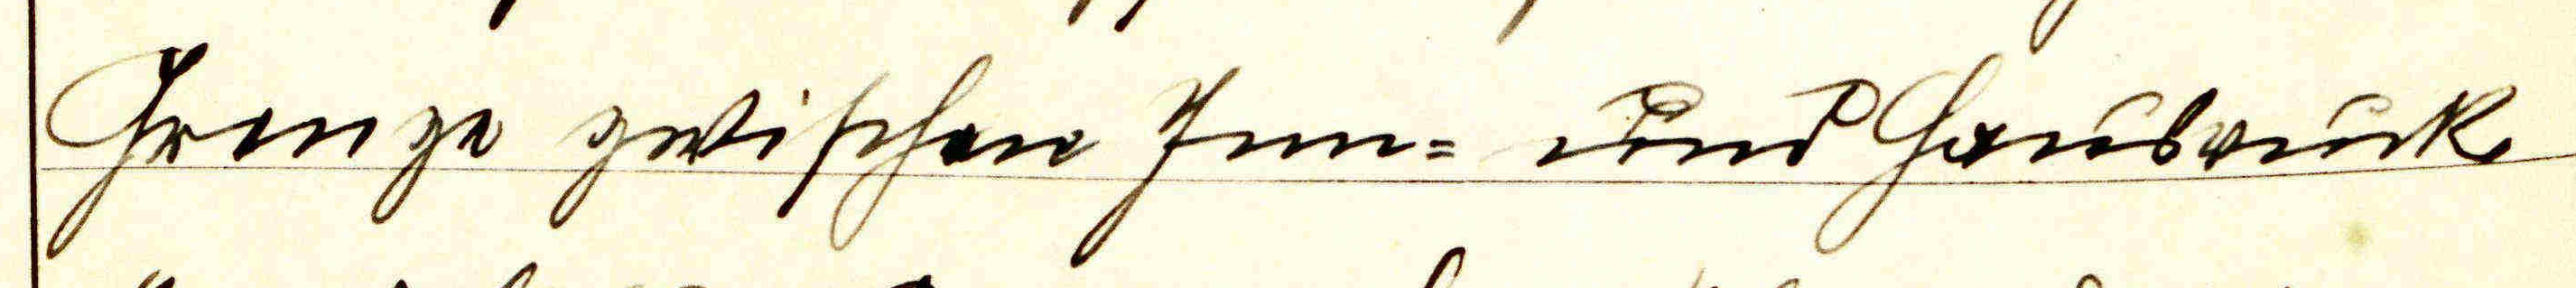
Grenze zwischen Inn- und Hausruck-
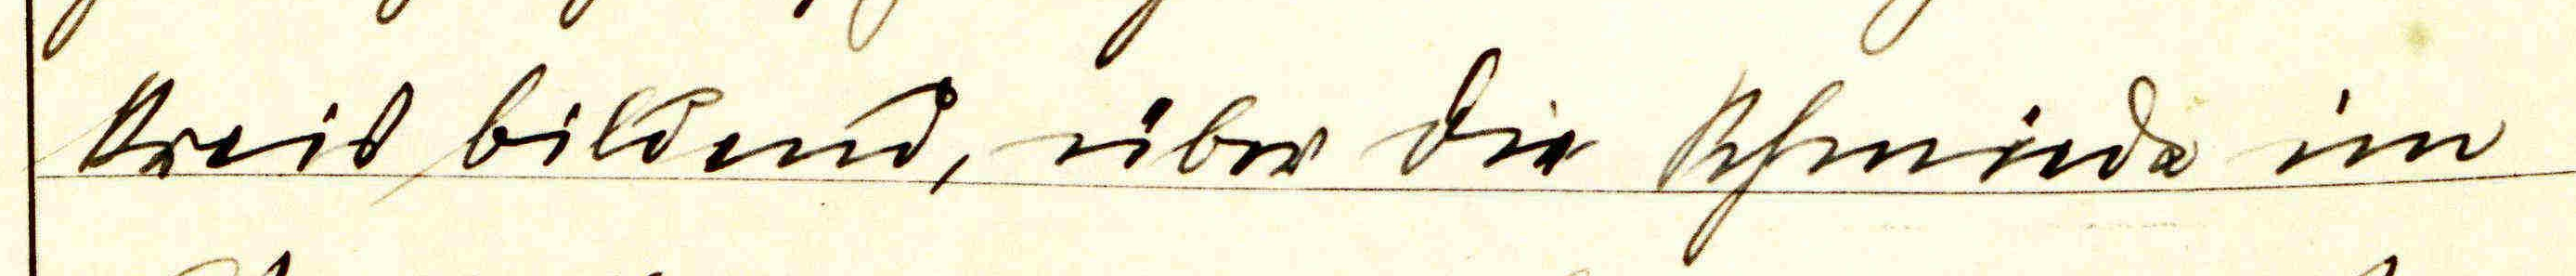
kreis bildend, über der Schmiede im
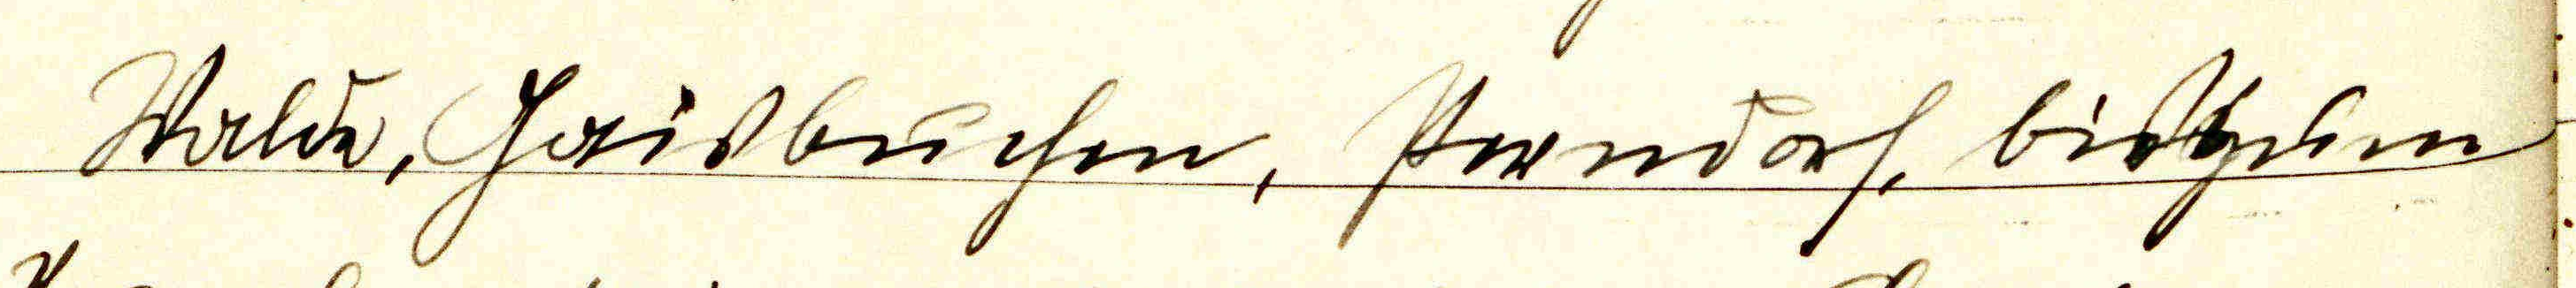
Walde, Gaisbuchen, Perndorf, bis zum
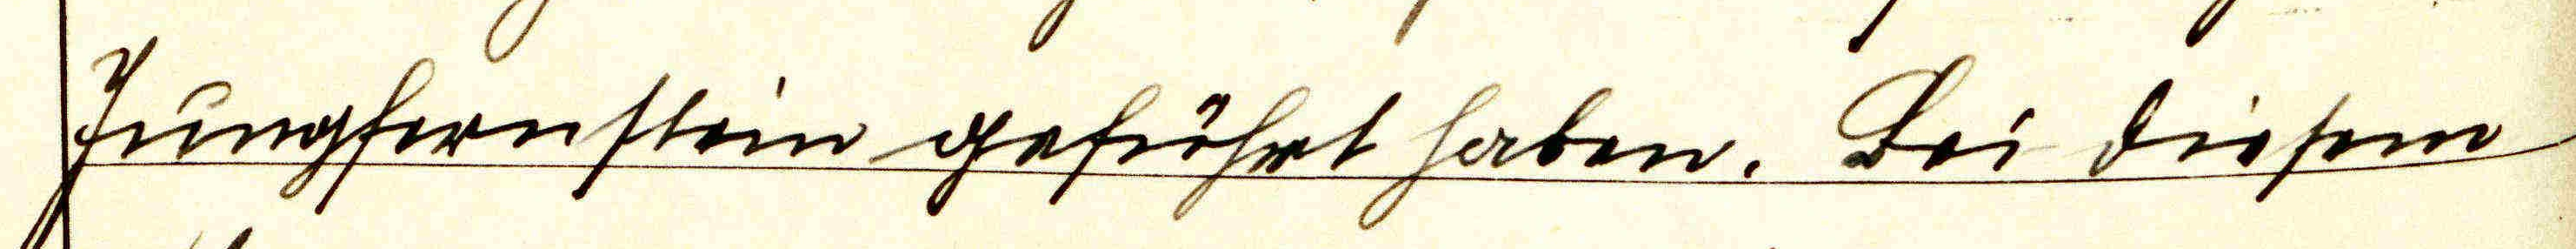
Jungfernstein geführt haben. Bei diesem
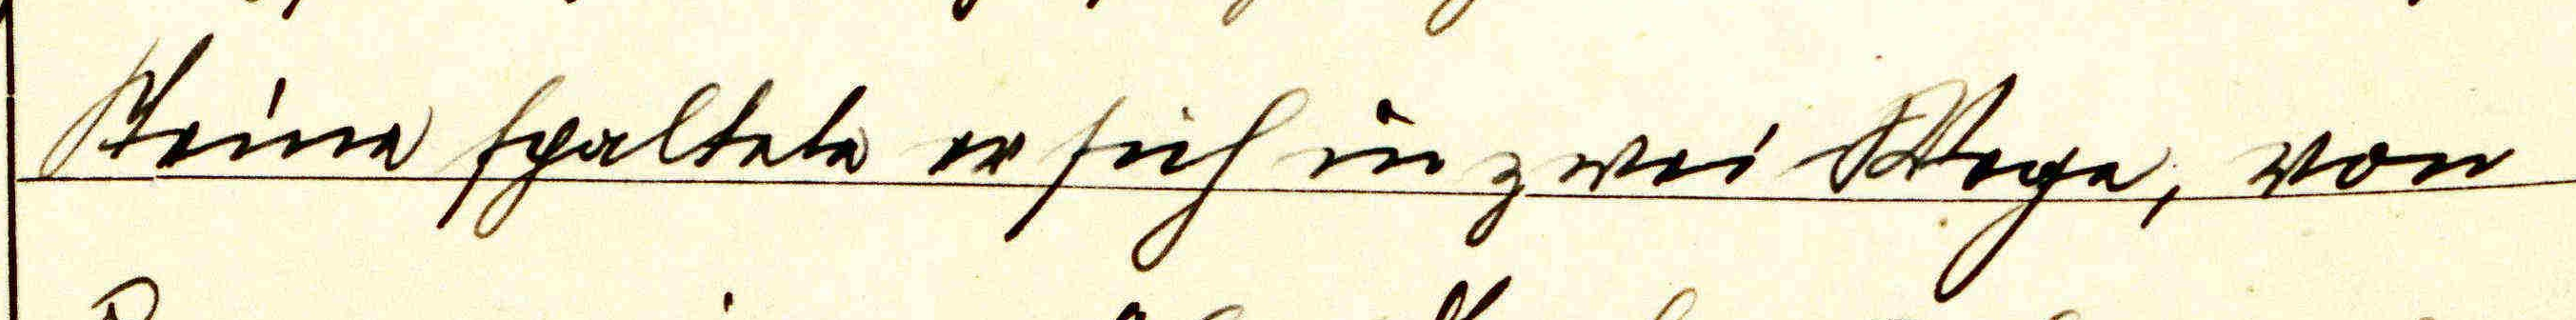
Steine spaltete er sich in zwei Wege, von
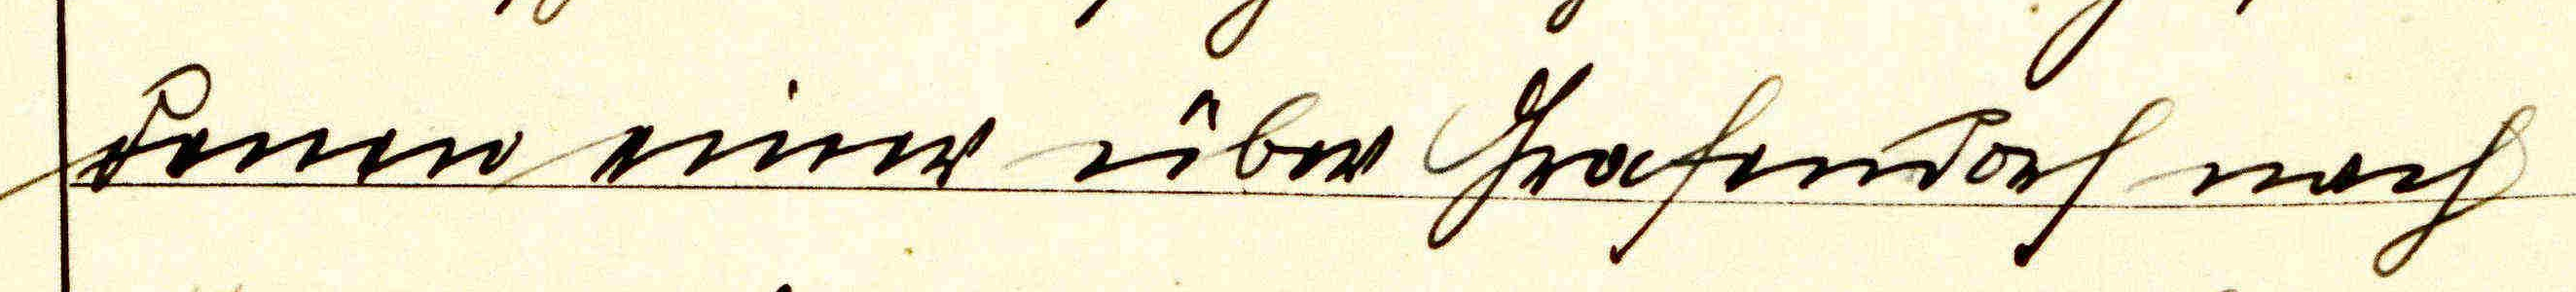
denen einer über Grafendorf nach
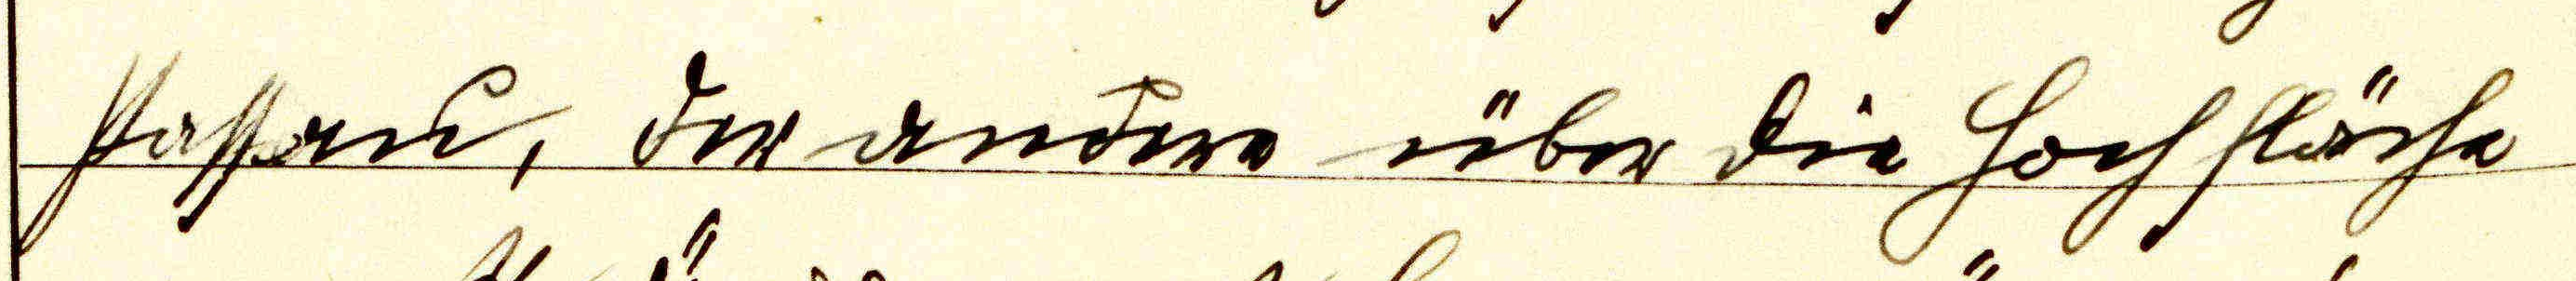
Passau, der andere über die Hochfläche
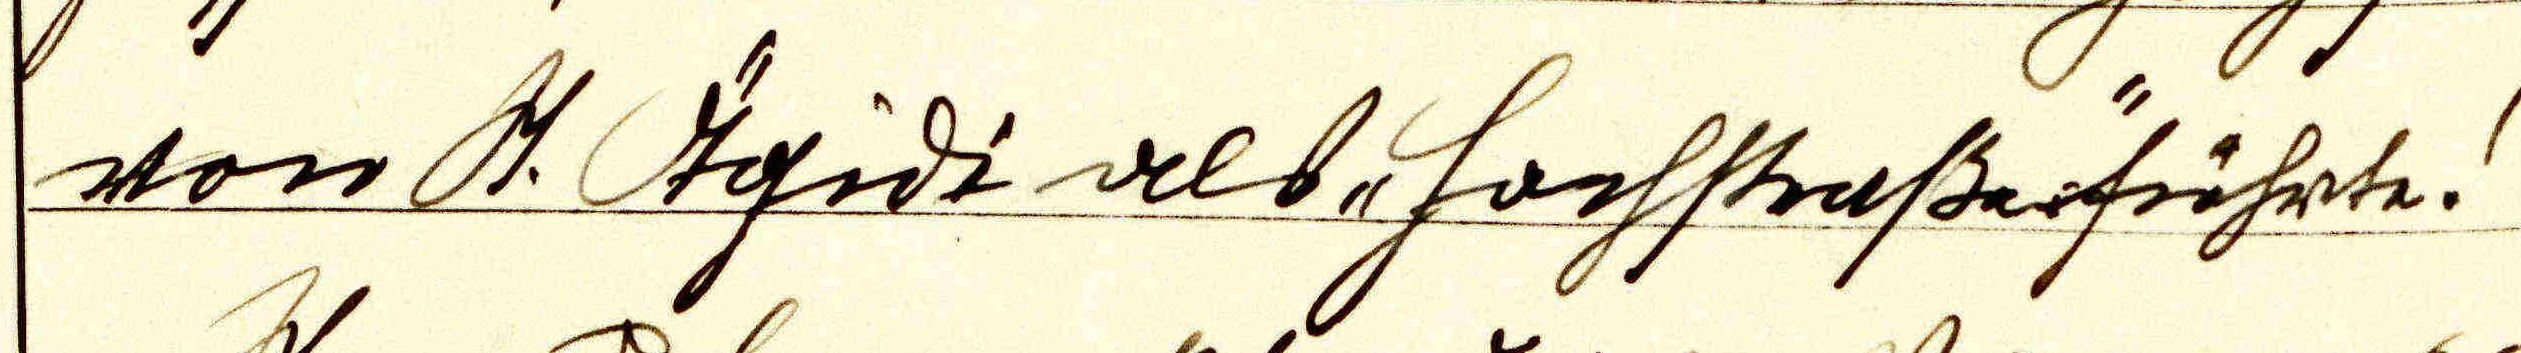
von St. Ägidi als „Hochstraße“ führte!
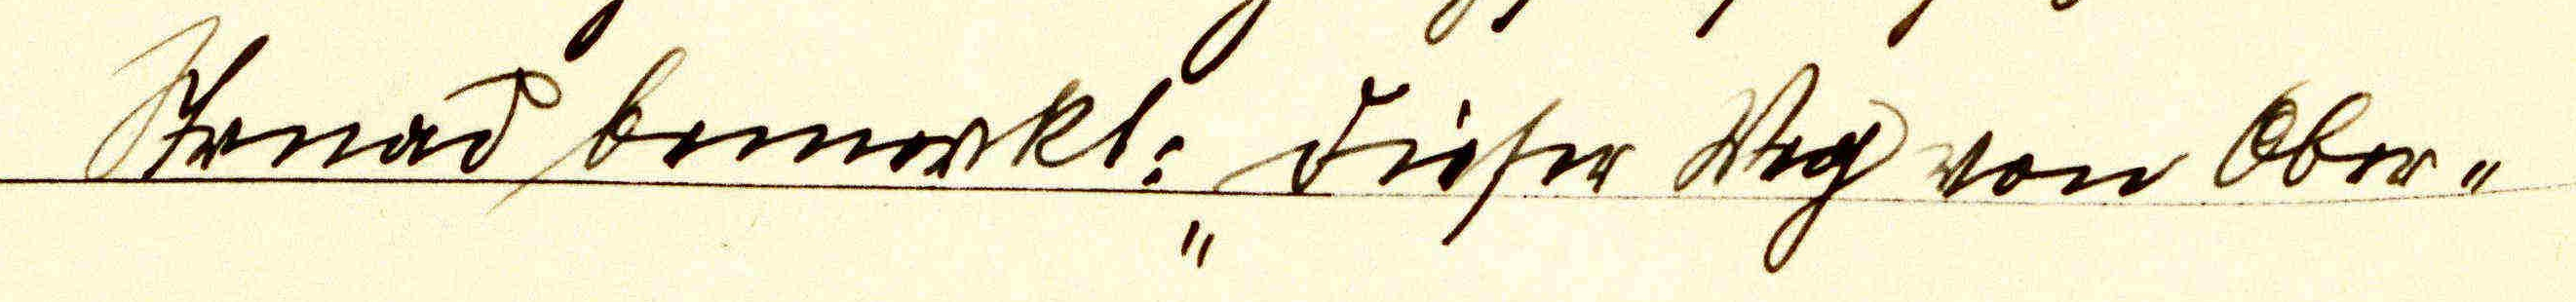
Strnad bemerkte: „dieser Weg von Ober-
